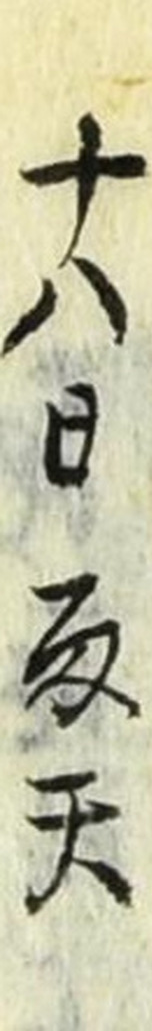十八日雨天
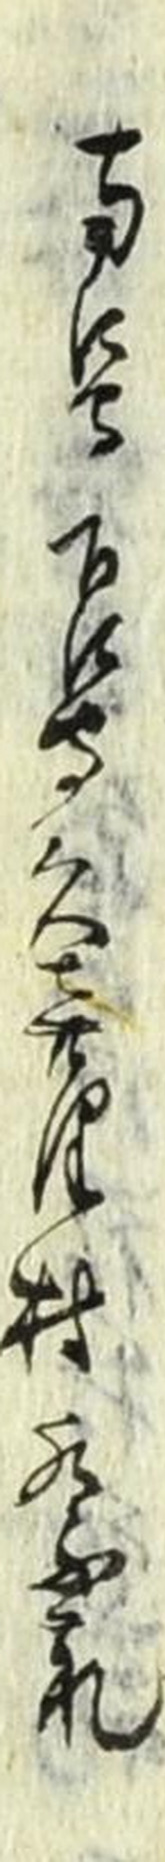南江守下江守久喜津村祭礼
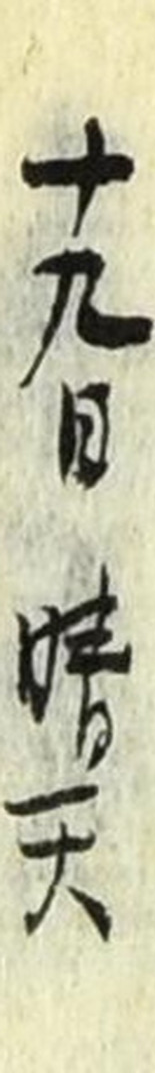十八日雨天
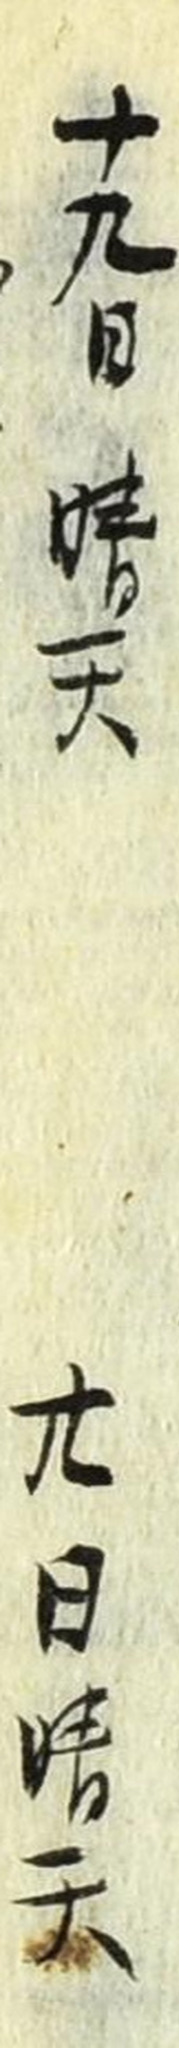十九日晴天廿日晴天
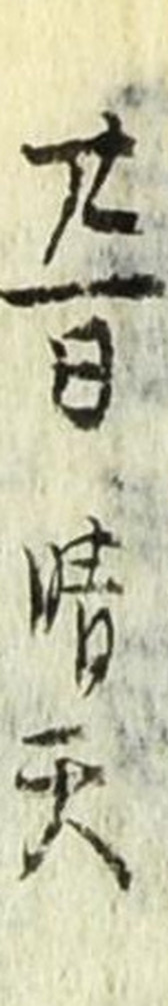廿一日晴天
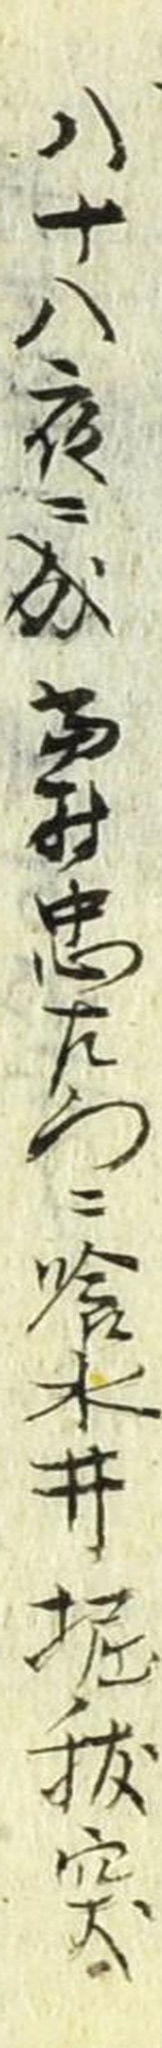八十八夜に成当村忠左衛門に喰水井堀抜突
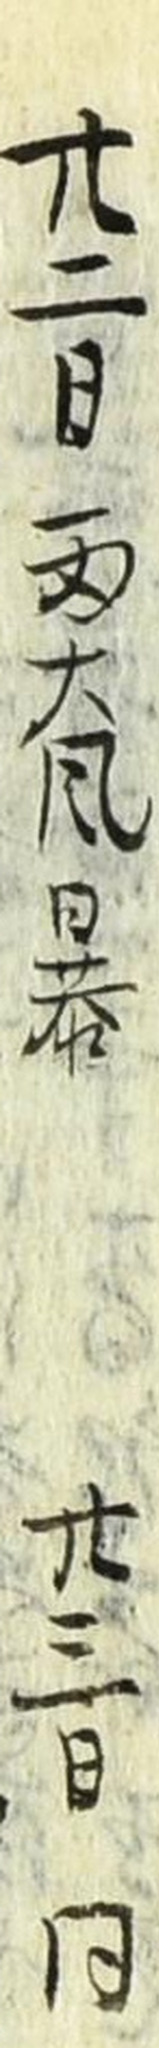廿二日雨大風暴廿三日同
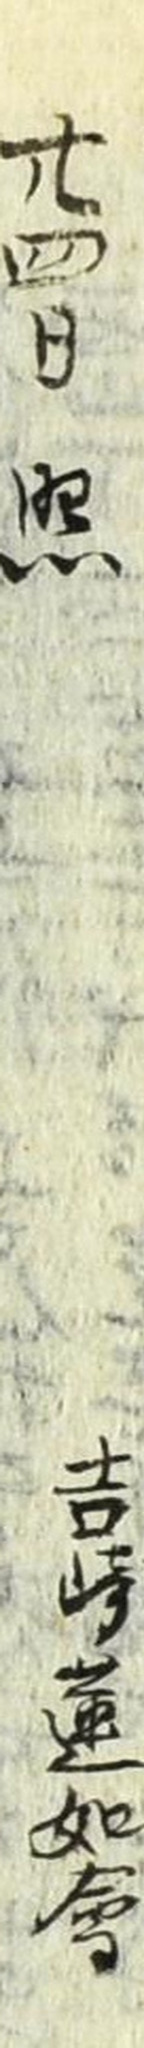廿四日照吉崎蓮如会
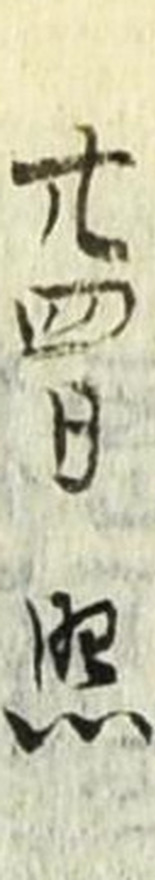廿五日照
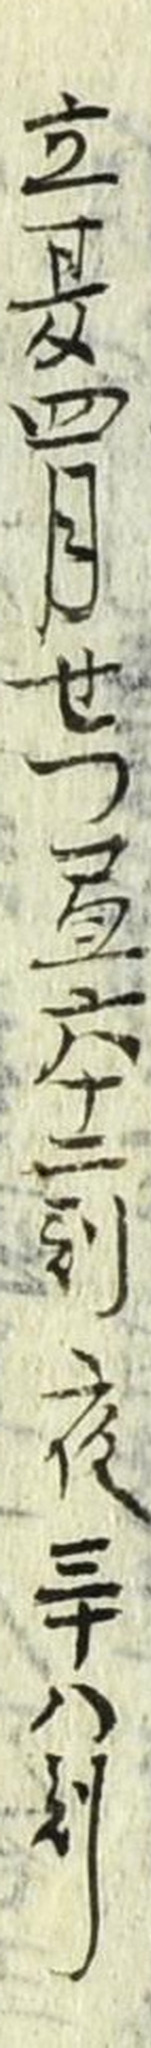立夏四月せつ昼六十二刻夜三十八刻
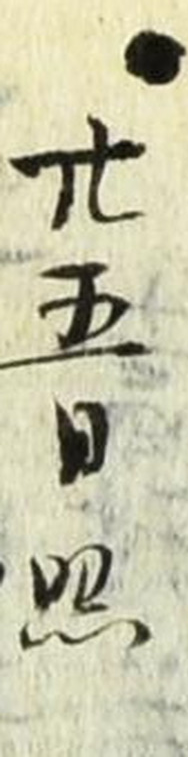廿五日照
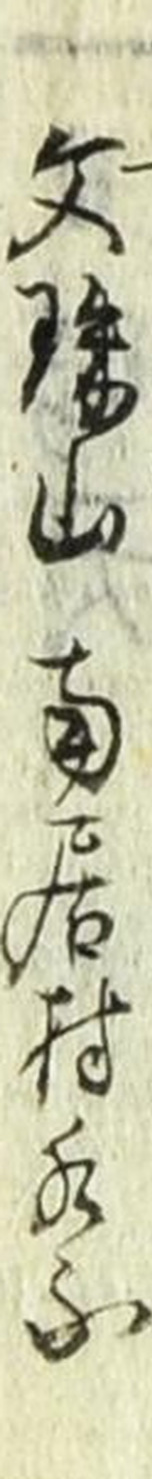文殊山南居村祭
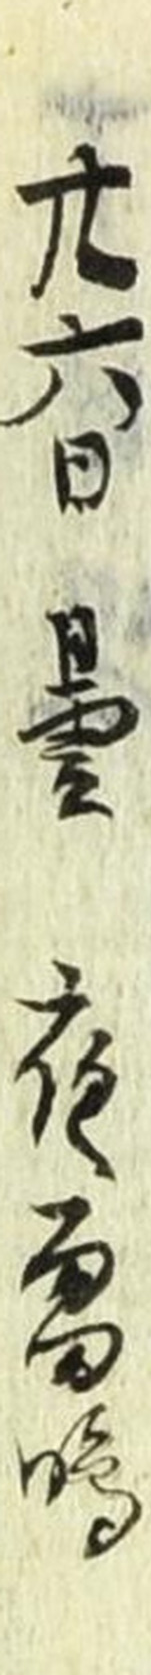廿六日曇夜雷鳴
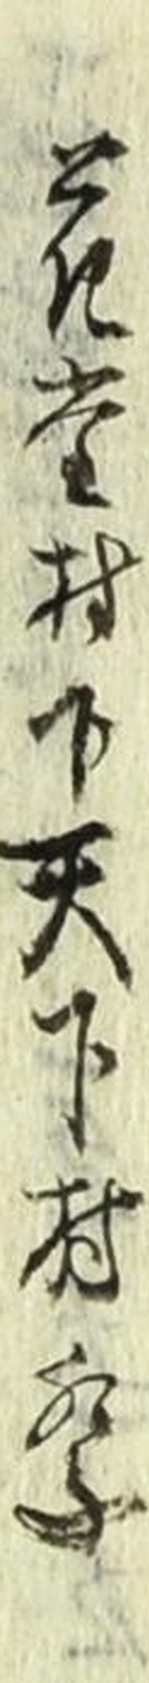花堂村下天下村祭
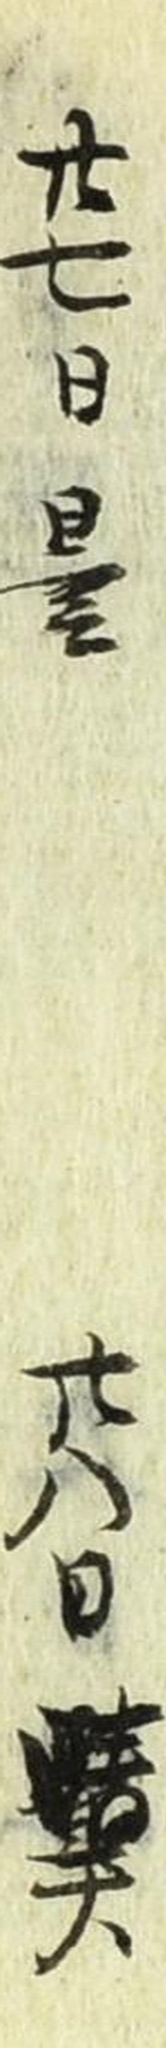廿七日曇廿八日晴天
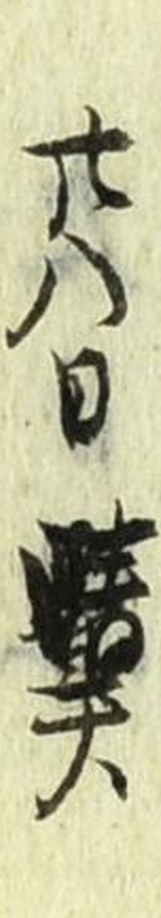廿一日晴天
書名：（日記）
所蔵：福井県文書館 Fukui Prefectural Archives
